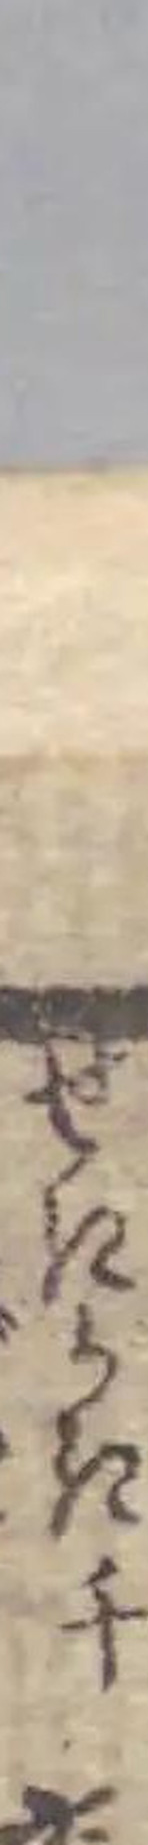せきかき千
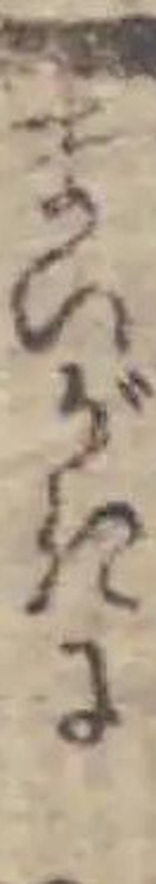まいがきに
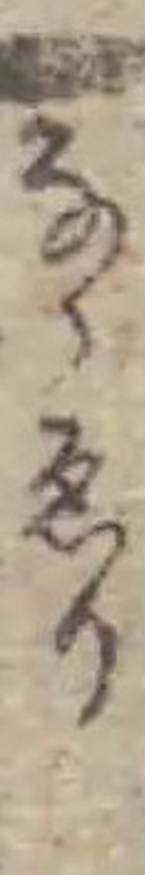ならゑり
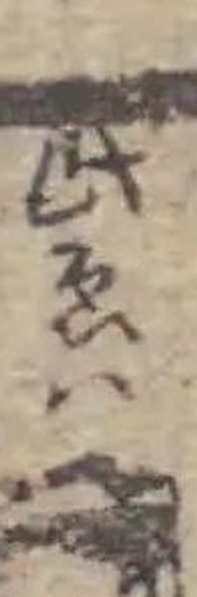此ゑは
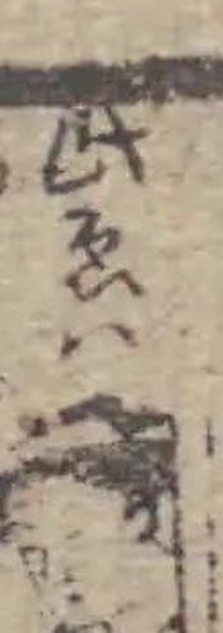此ゑは
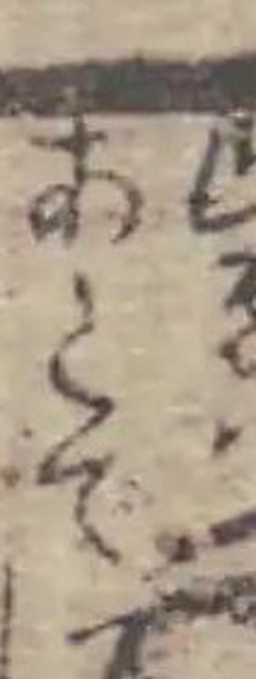あとで
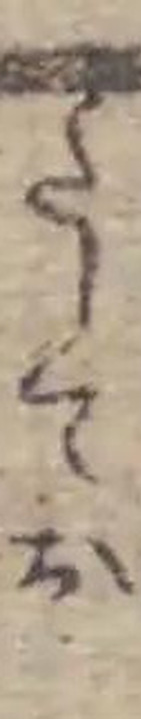たしてお
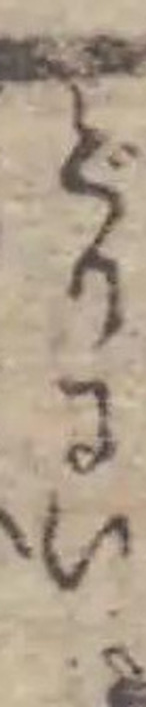どりにい
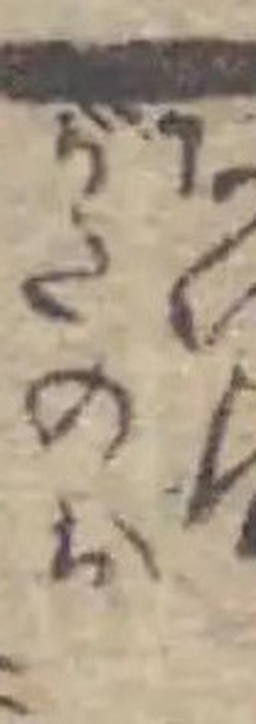がたのお
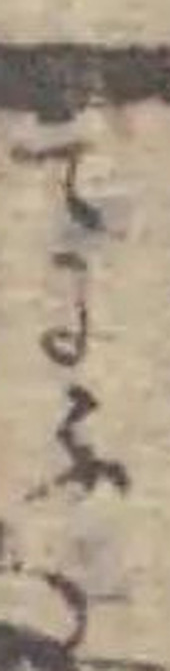てにふ
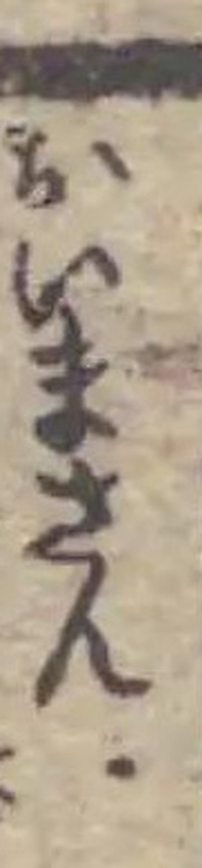おいまさん
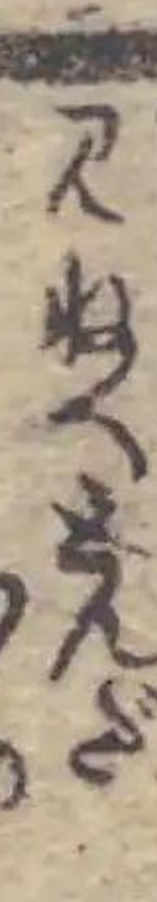見ねへとんだ
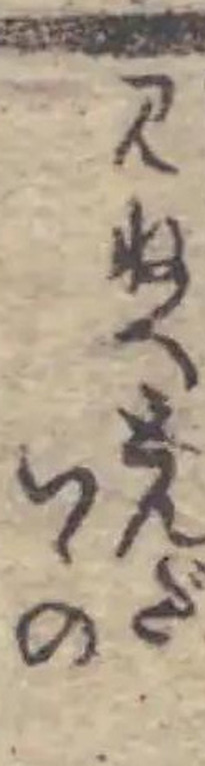見ねへとんだ
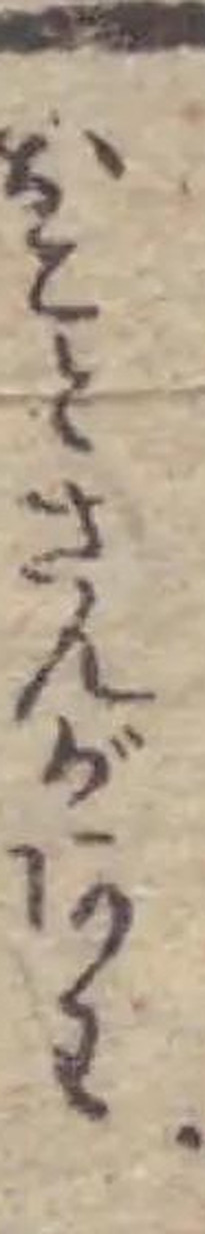おことさんがあわ
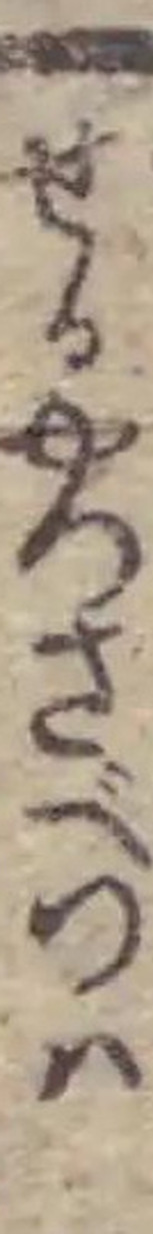せるやつさべつは
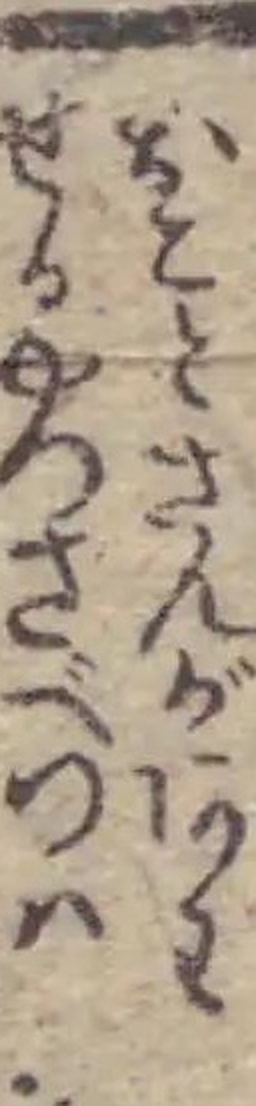せるやつさべつは
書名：色男其処此処 3巻
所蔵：国立国会図書館 National Diet Library, JAPAN
